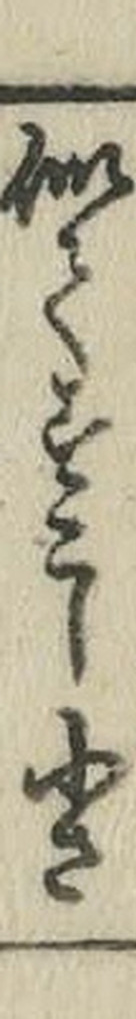似てすこし小さ
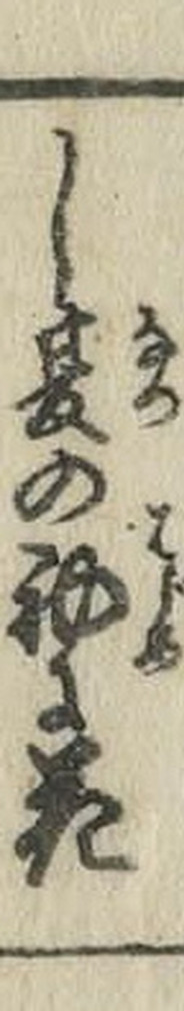し夏の初に花
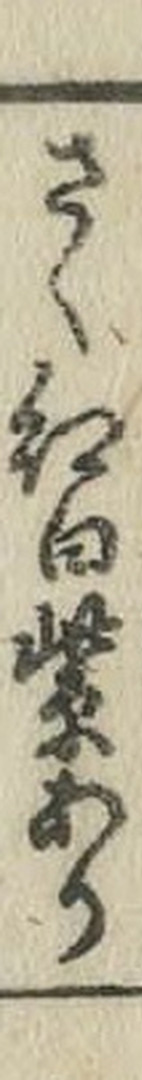さく紅白紫あり
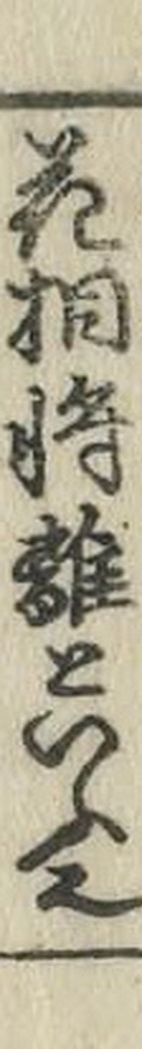花相将離といふ也
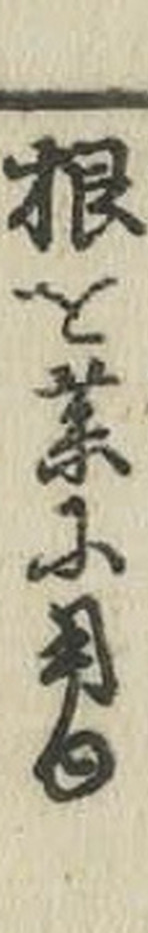根を薬に用ゆ
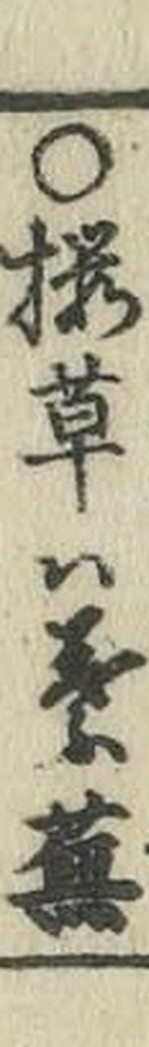○桜草は葉蕪
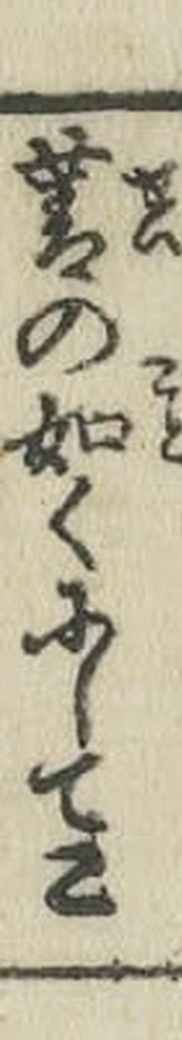菁の如くにしてこ
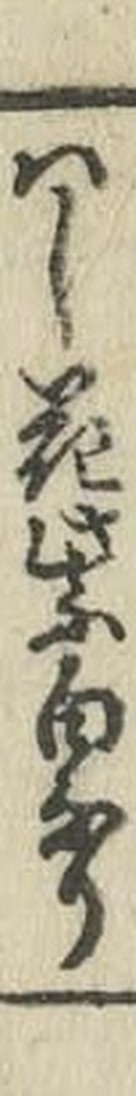はし花紫白なり
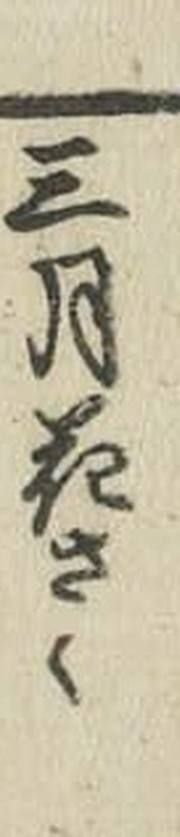三月花さく
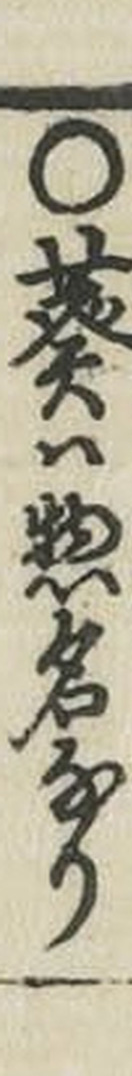○葵は惣名なり
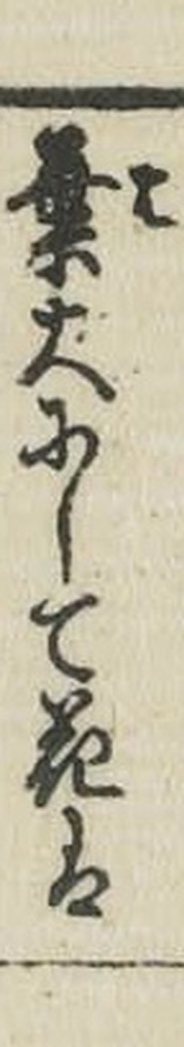葉大にして花は
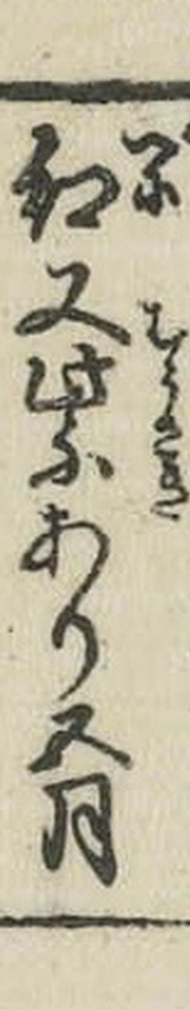紅又紫あり五月
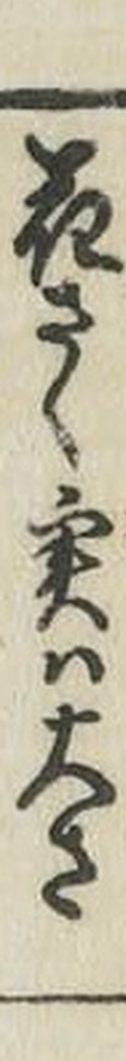花さく実は大さ
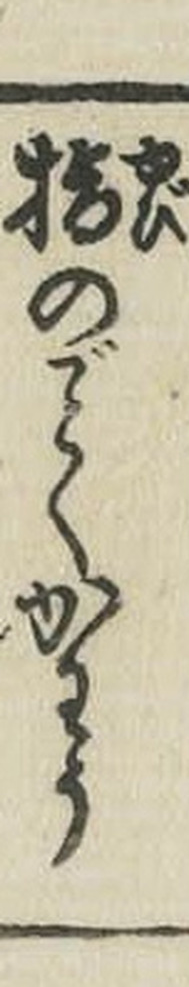指のごとくかわう
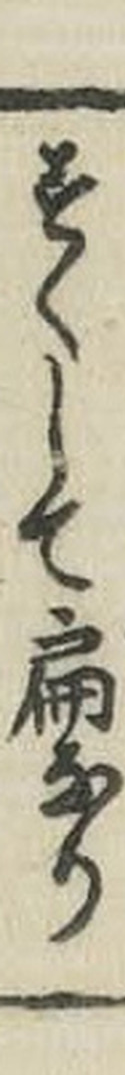すくして扁なり
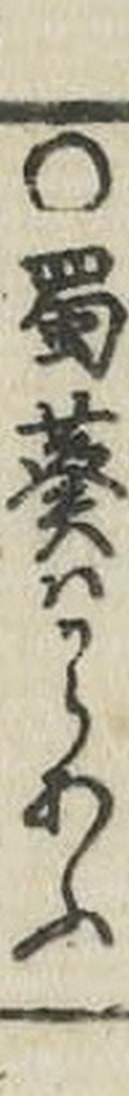○蜀葵はからあふ
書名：増補頭書訓蒙図彙大成 10巻 9:巻之20
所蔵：東京学芸大学教育コンテンツアーカイブ
